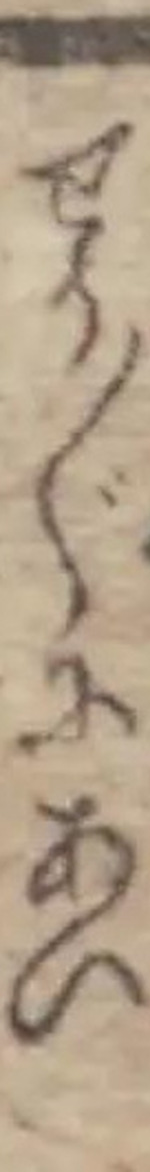せう〴〵にあい
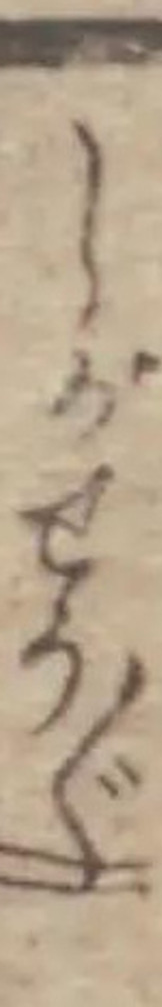しがせう〴〵
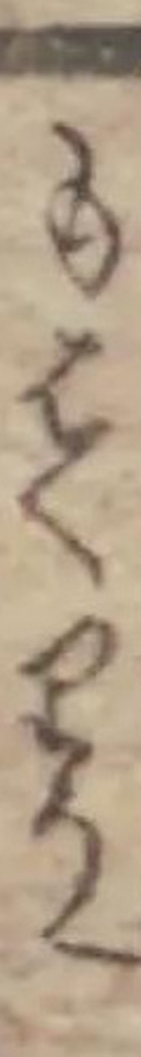もはくりう
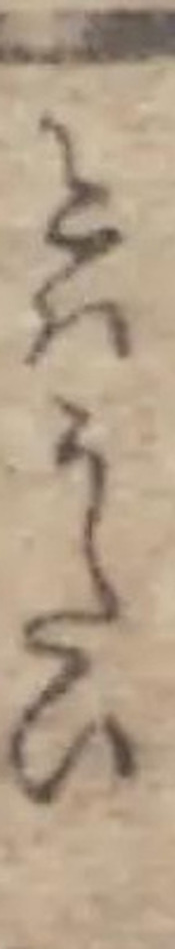とハうたい
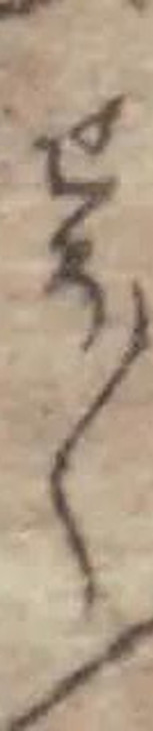せう〳〵
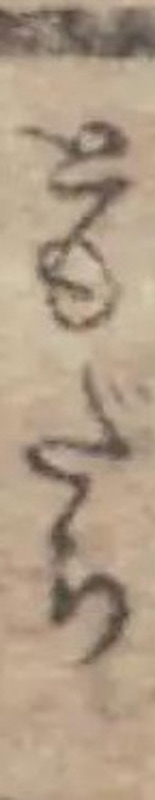ともだち
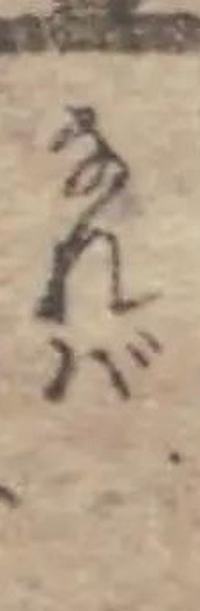なれバ
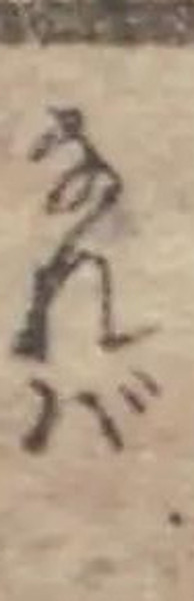なれバ
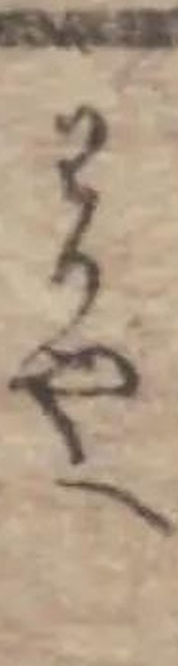わかやへ
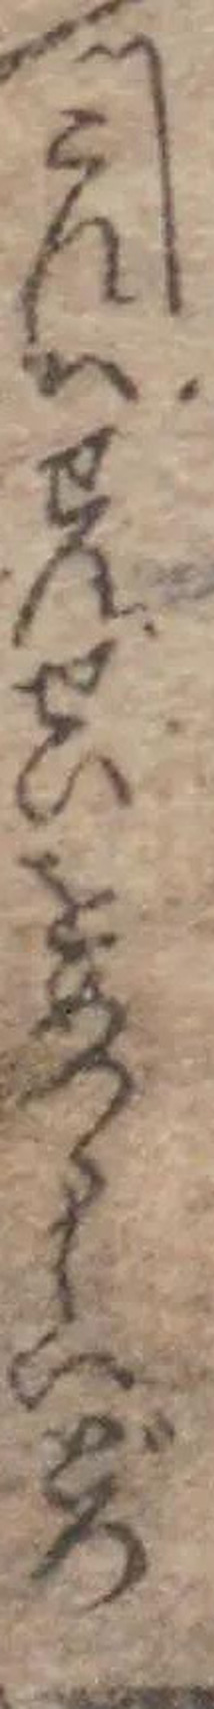これハせんせいをめつらしいどつ
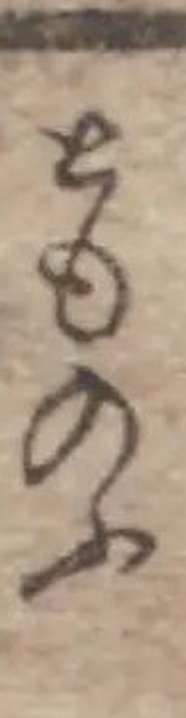とものふ
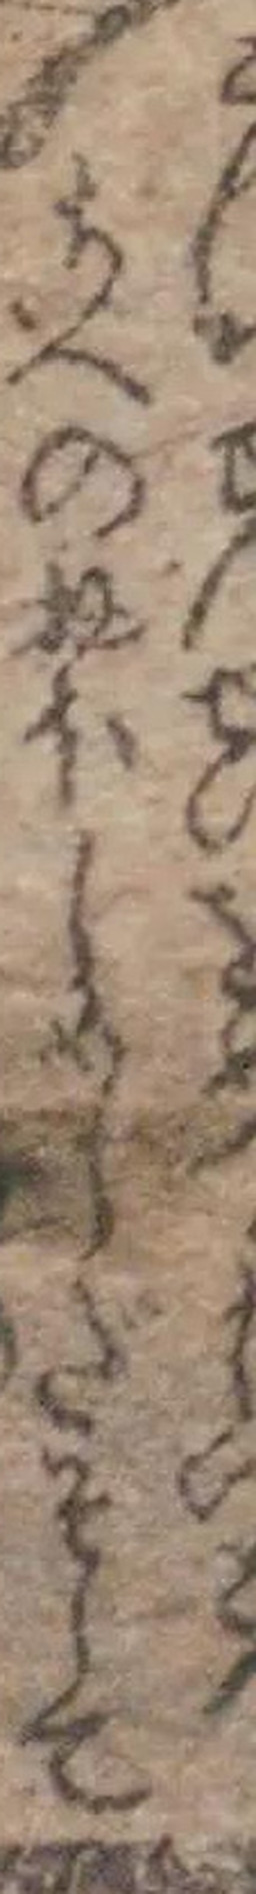ちへのおほしめしだそして

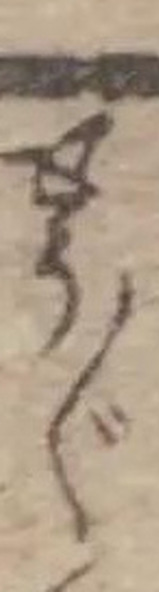せう〴〵
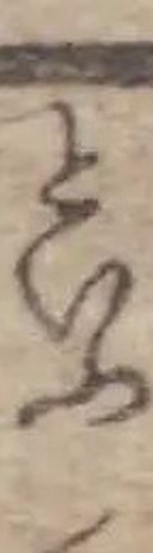といふ
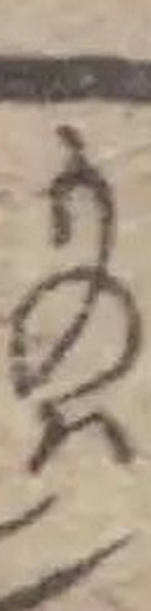ものハ
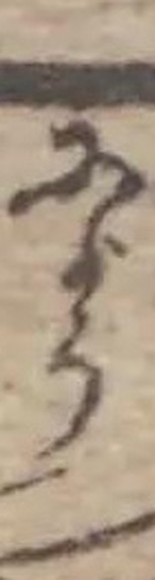によう
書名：草紙の曙 3巻
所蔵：国立国会図書館 National Diet Library, JAPAN
